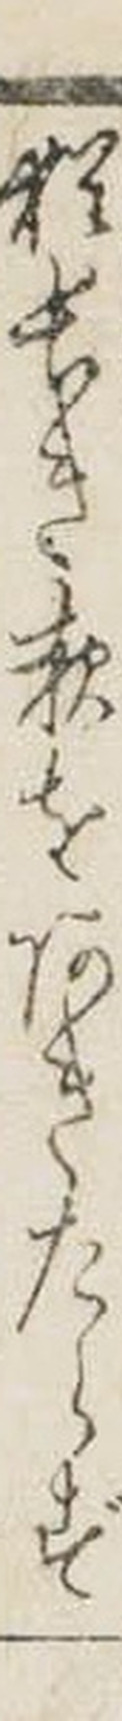猶長き夜をあきたらず
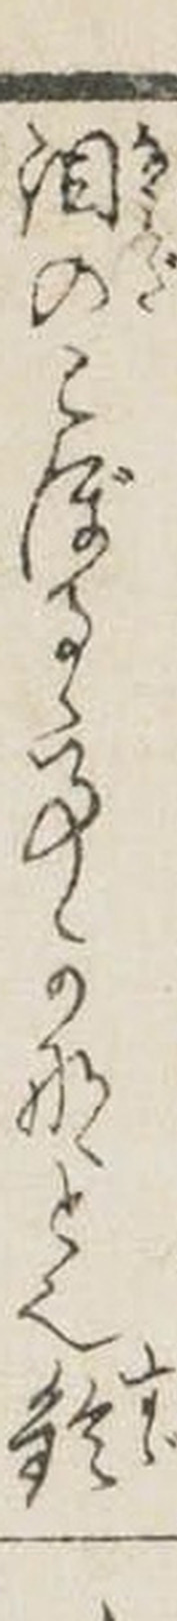泪のこぼるゝ事かなと也鈴
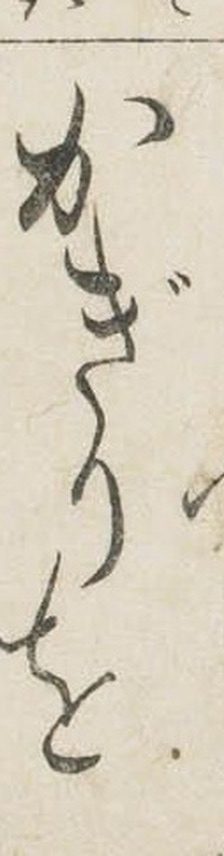かぎりを
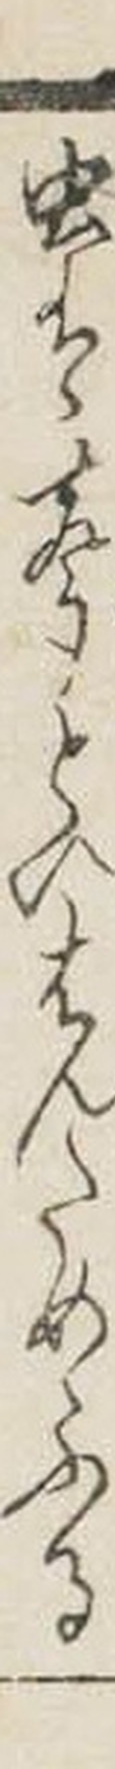虫は声といはんためふる
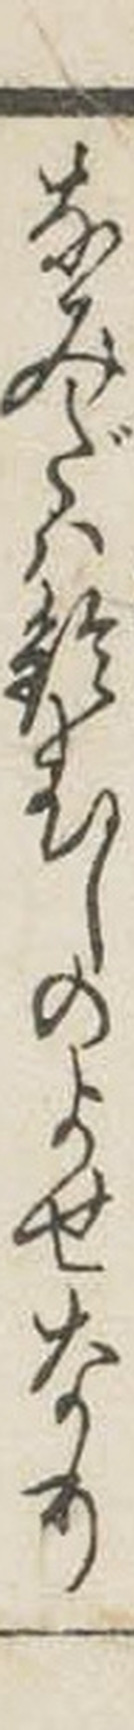なみだは鈴むしのよせなり
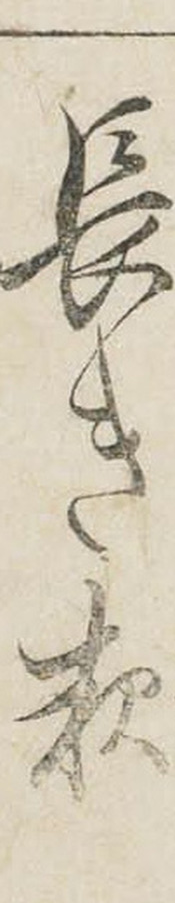長き夜
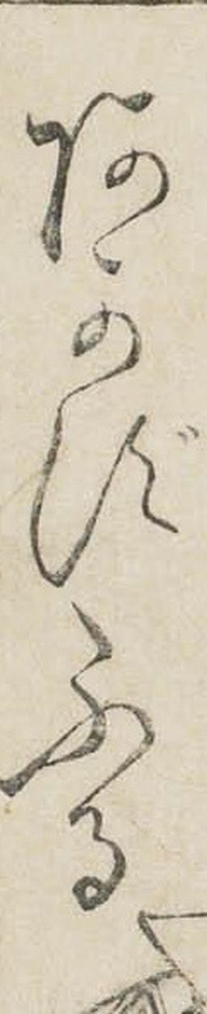あかずふる
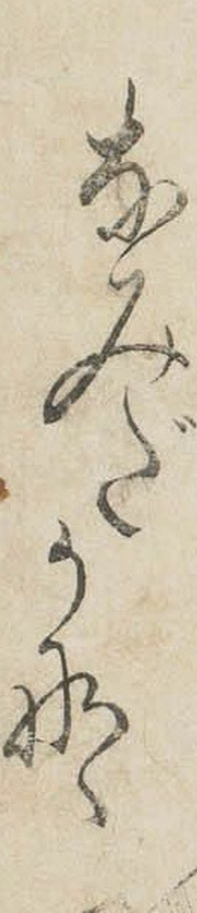なみだかな

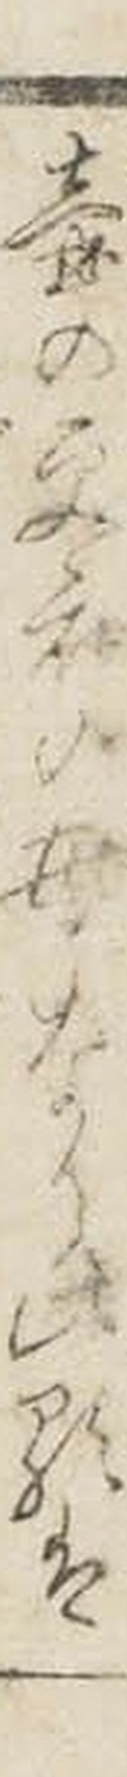壺の更衣の母なり此歌は
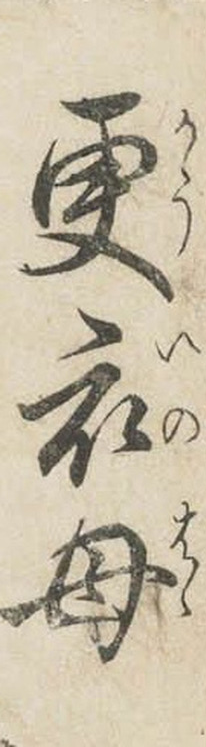更衣母
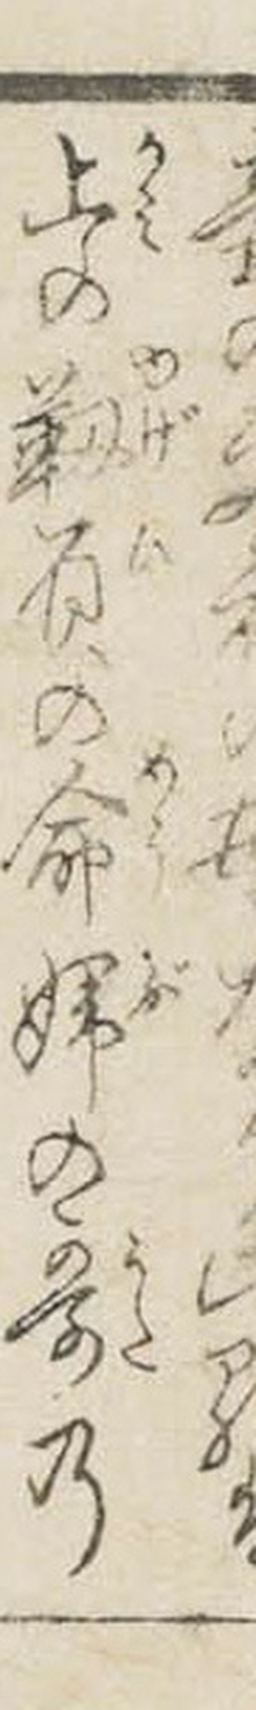上の靫負の命婦の哥の
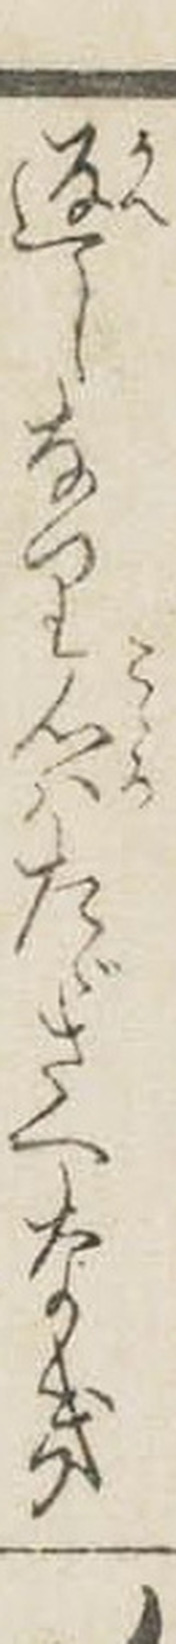返しなり心はたゞさへなき
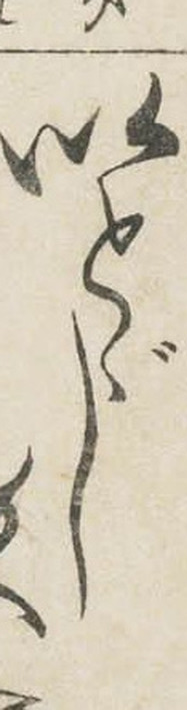いとゞし
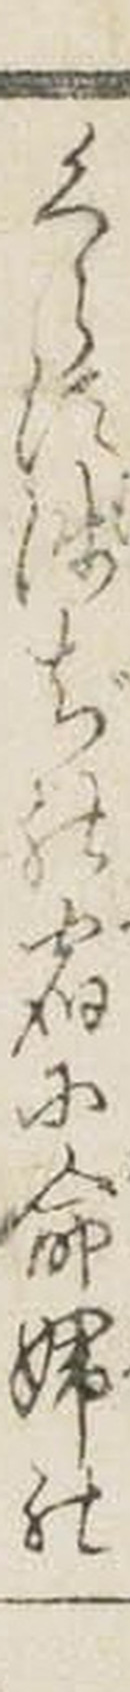くらす浅ぢの宿に命婦の
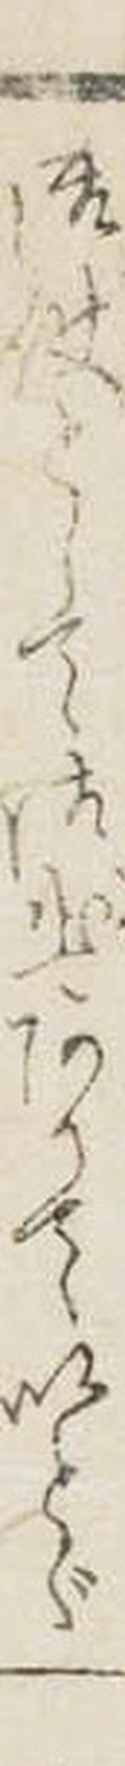御使として御出ありていとゞ
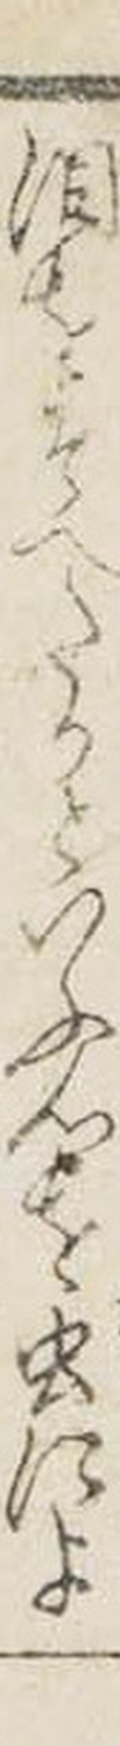泪をそへたりいふ心を虫によ
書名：源氏百人一首
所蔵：東京学芸大学教育コンテンツアーカイブ
